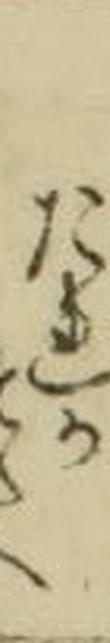たれか
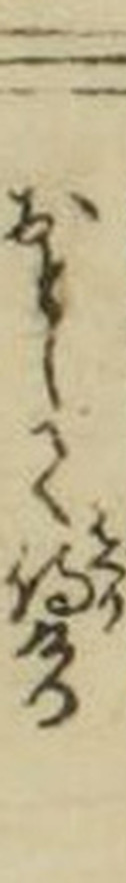おとして侍ける
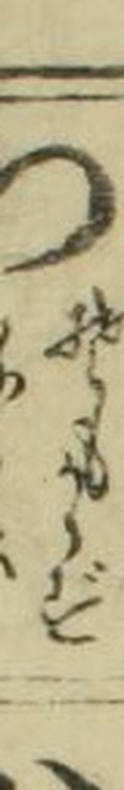からず
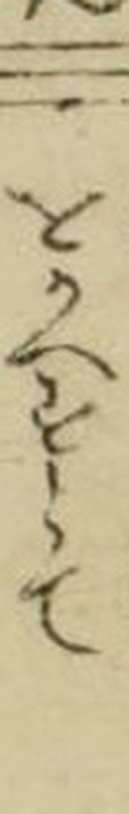をかへすとて
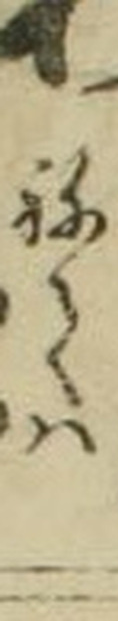ねては
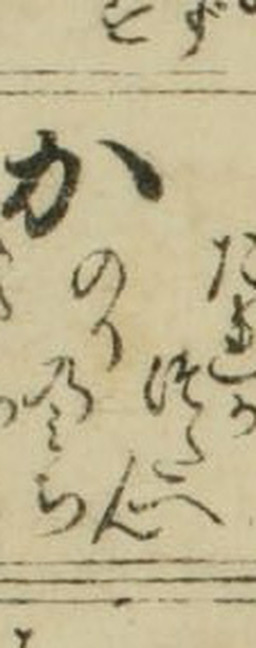のりのみち
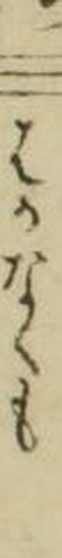はかなくも
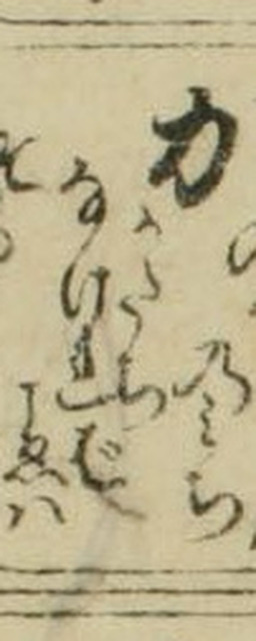なければ
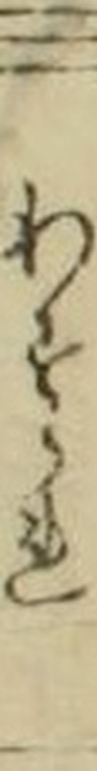わすられ
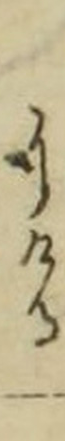にける
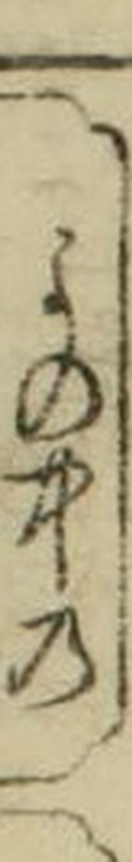よの中の
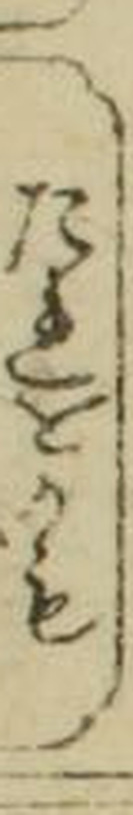たれをかも
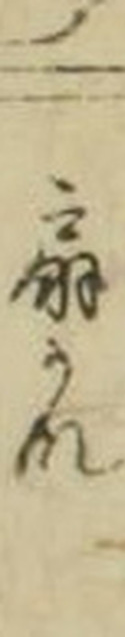扇かな
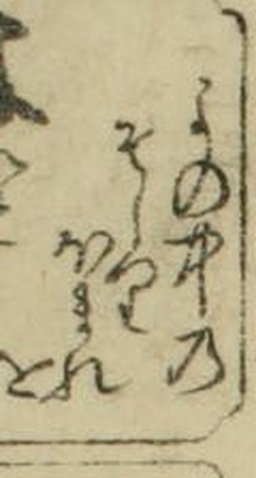そしり
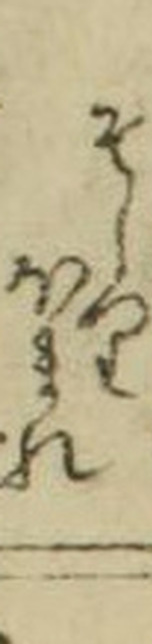ほまれ
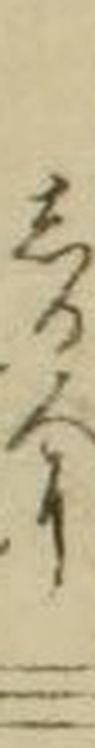しる人に
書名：女源氏教訓鑑
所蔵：東京学芸大学附属図書館
